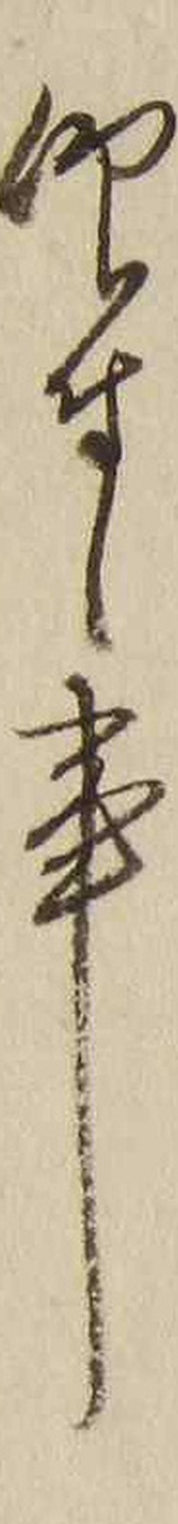仰付候事

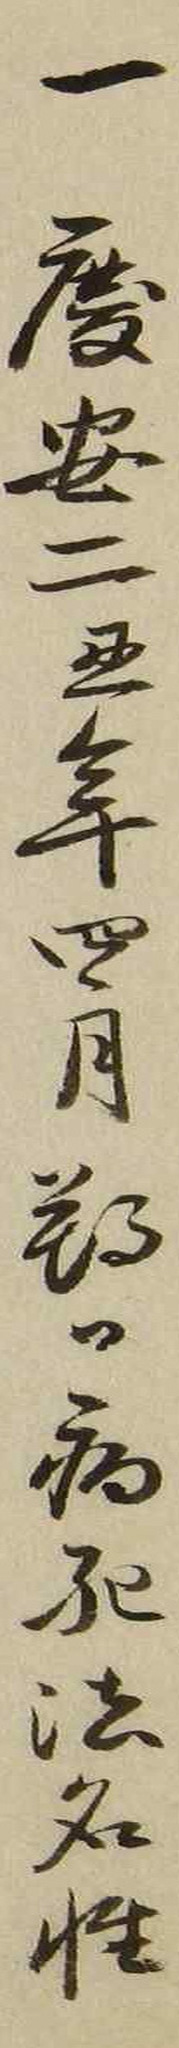一慶安二丑年四月朔日病死法名性
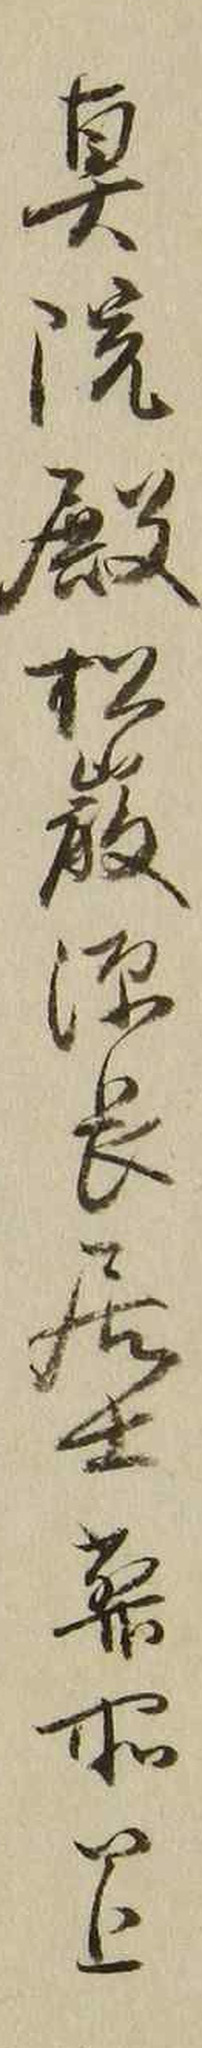真院殿松巌源長居士葬所同上
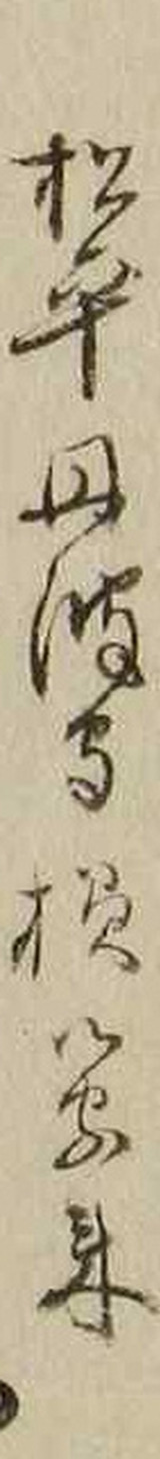松平丹波守様家来
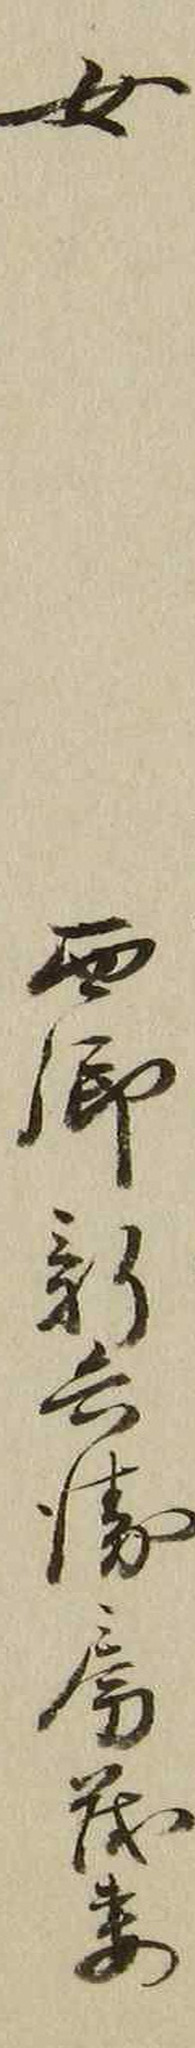女西郷新兵衛房茂妻
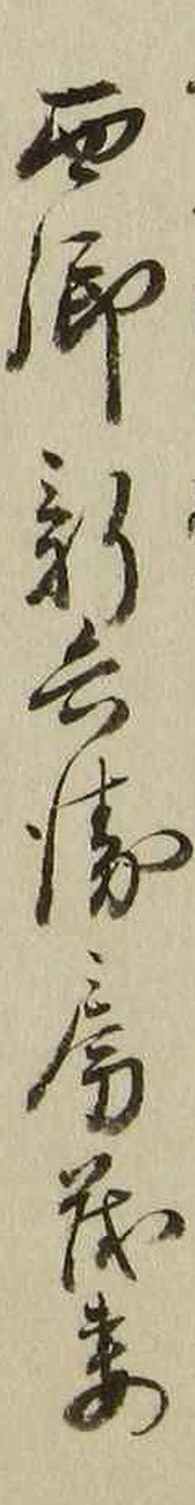女西郷新兵衛房茂妻
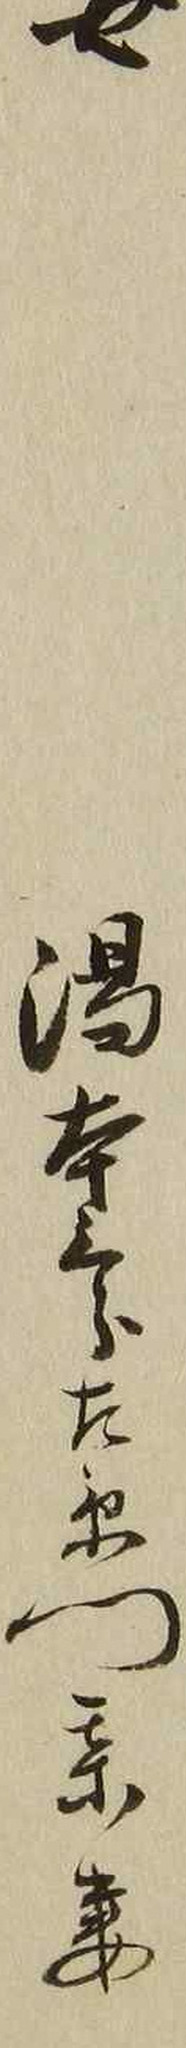女湯本三郎左衛門系妻
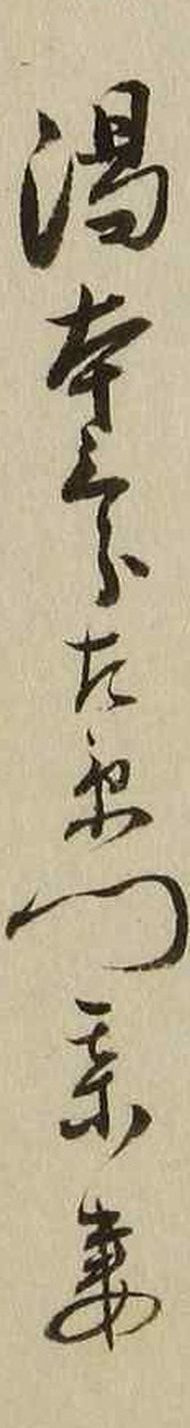女湯本三郎左衛門系妻
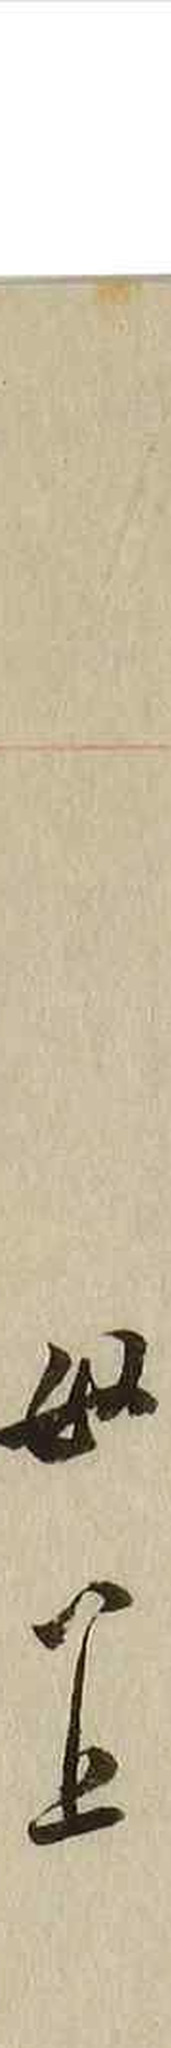母同上
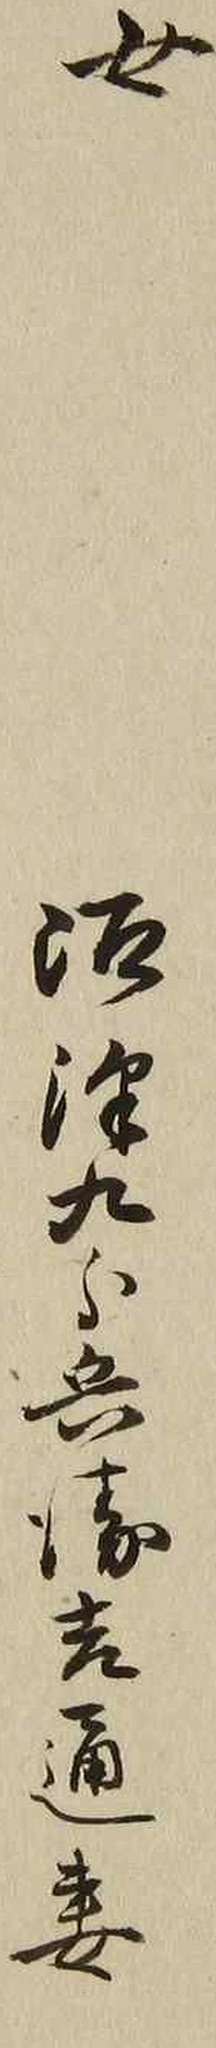女沼沢九郎兵衛吉通妻
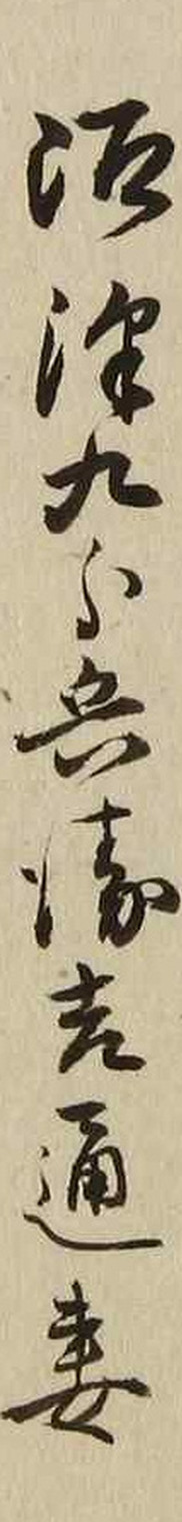女沼沢九郎兵衛吉通妻

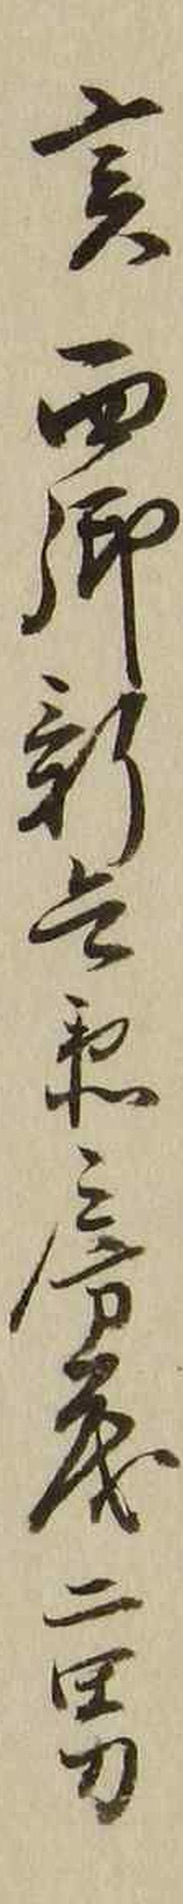実西郷新兵衛房茂二男
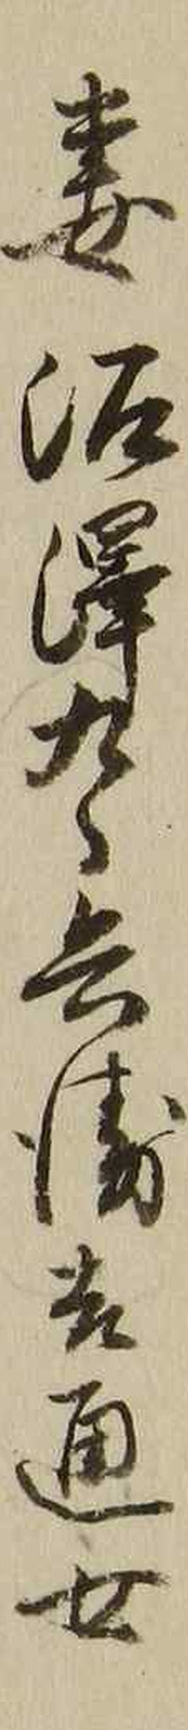妻沼沢九郎兵衛吉通女
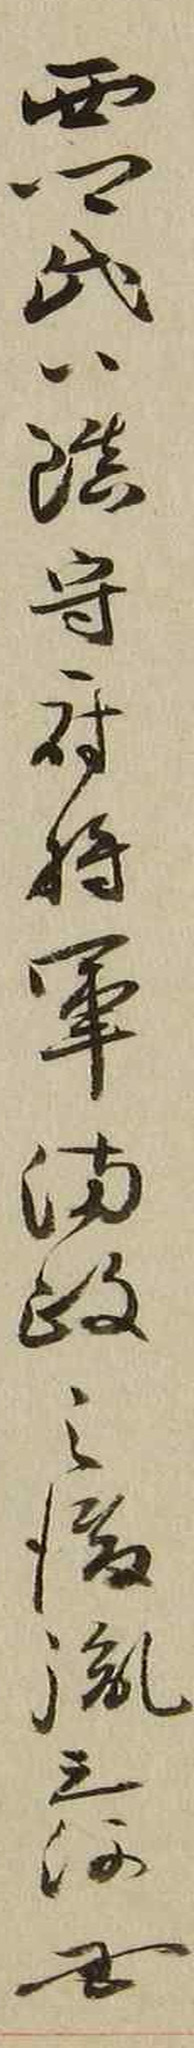西郷氏は鎮守府将軍満政之後胤三河国
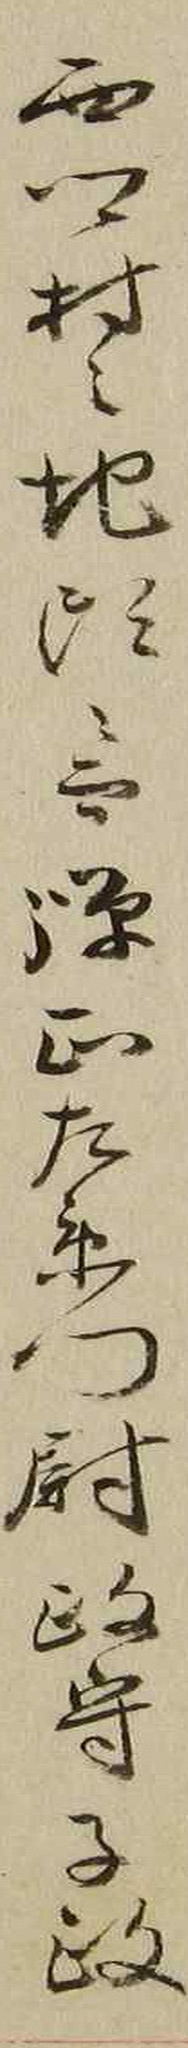西郷村之地頭に而弾正左衛門尉政守子政
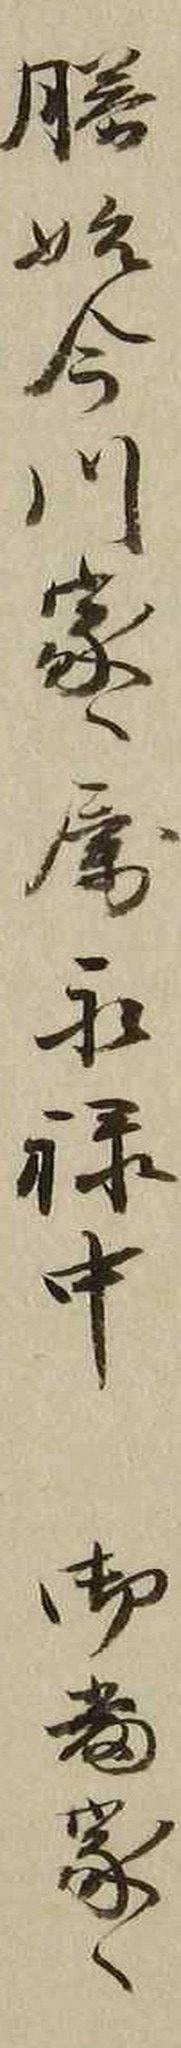勝始今川家へ雇永禄中御当家へ
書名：諸士系譜　巻之269　さ之部1
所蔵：会津若松市立会津図書館
